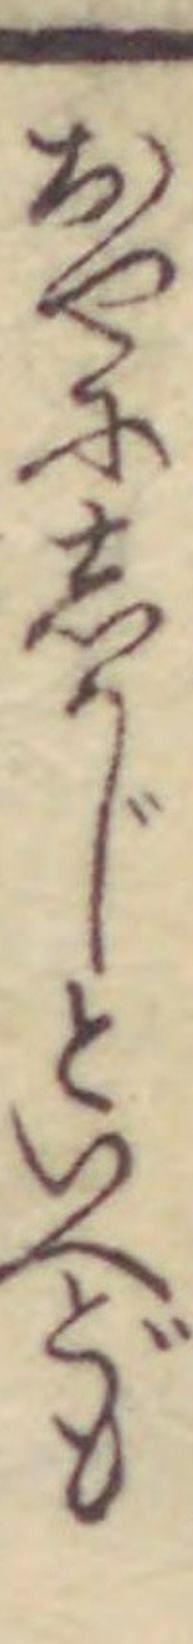おやにしかじといへども
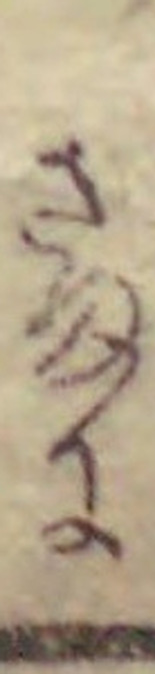さまに
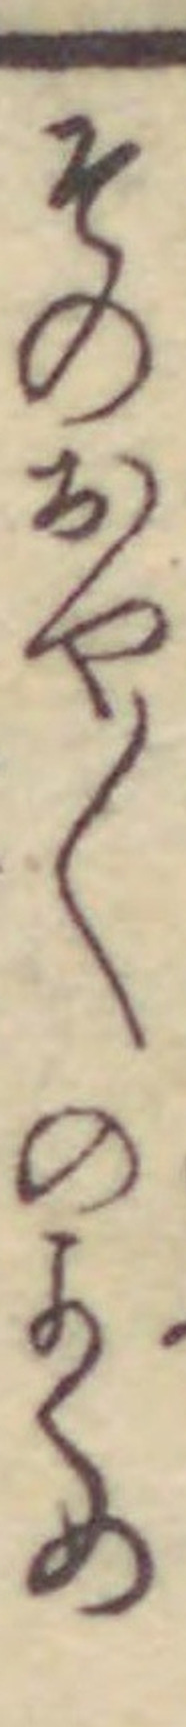そのおや〳〵のよくめ
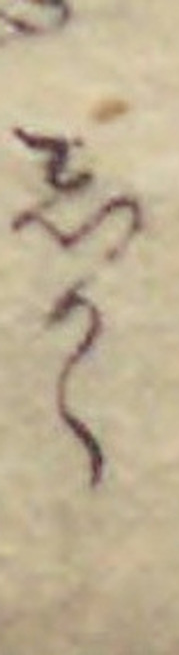しから
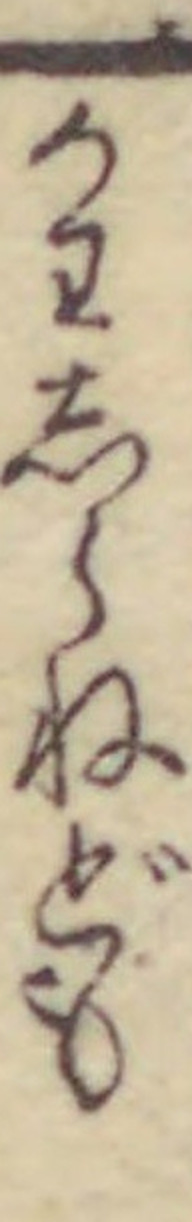かわしらねども
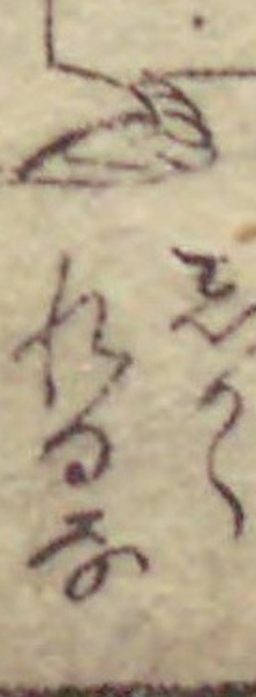れるな
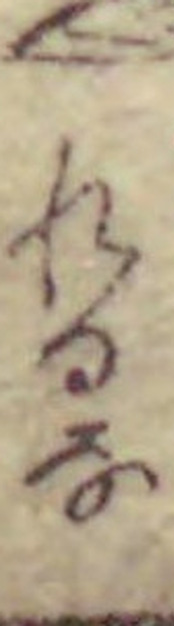れるな
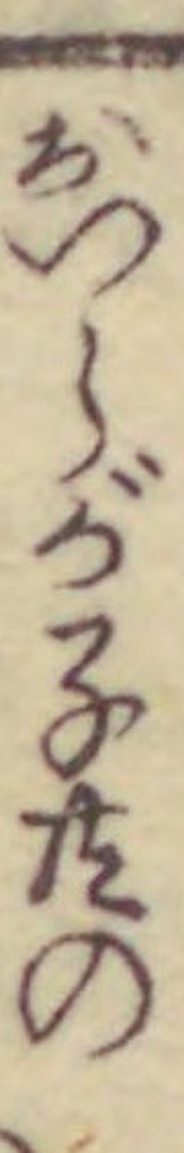おいらが子共の
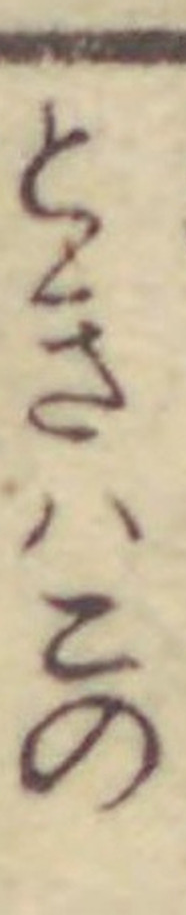ときはこの
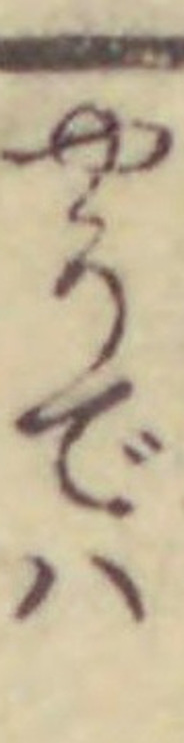やうでは
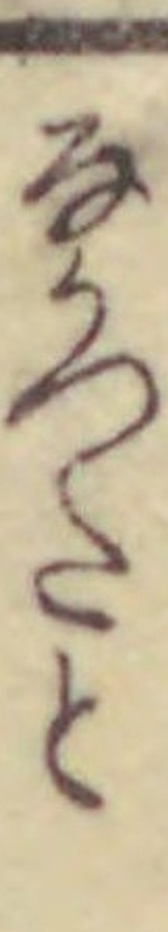なかつたと
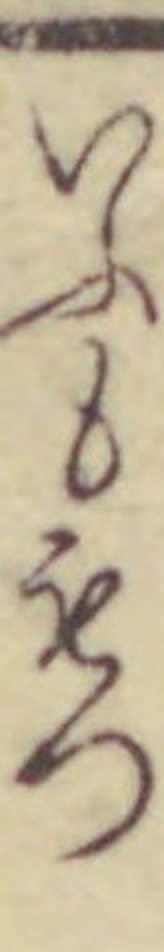いふももつ
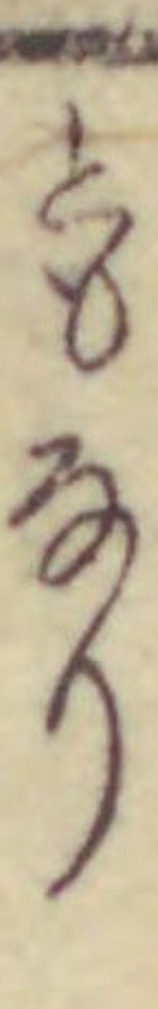ともなり
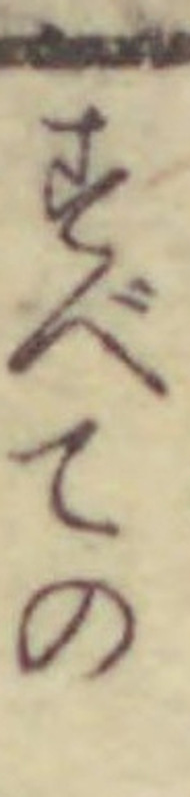すべての
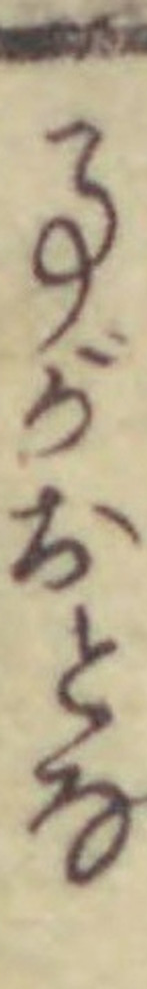事がおとな
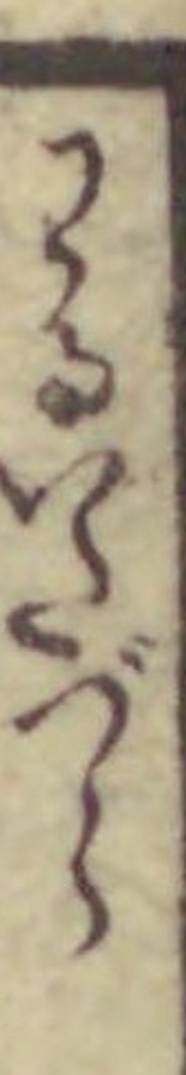わるいたづら
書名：大通人穴[サガシ] 3巻
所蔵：国立国会図書館 National Diet Library, JAPAN
